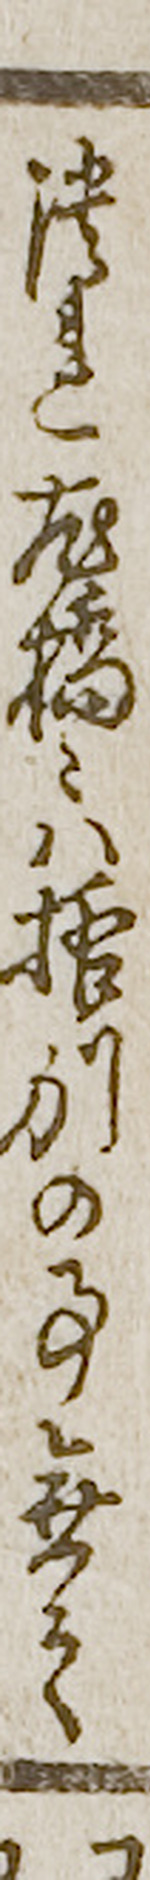潰れ尤橋々は格別の事無之
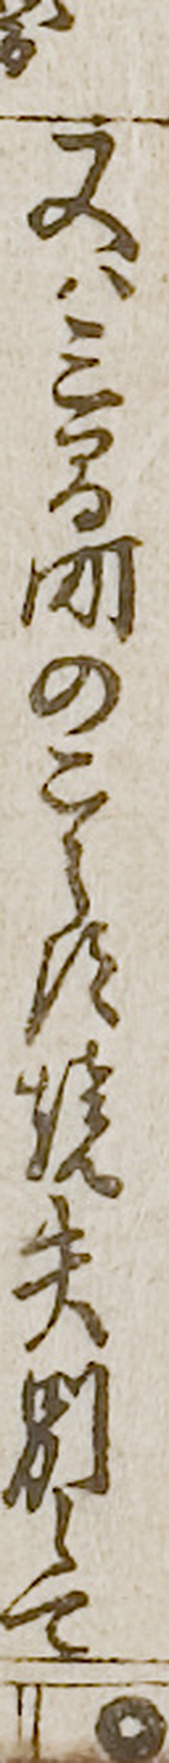又は三間町のこらす焼失別して
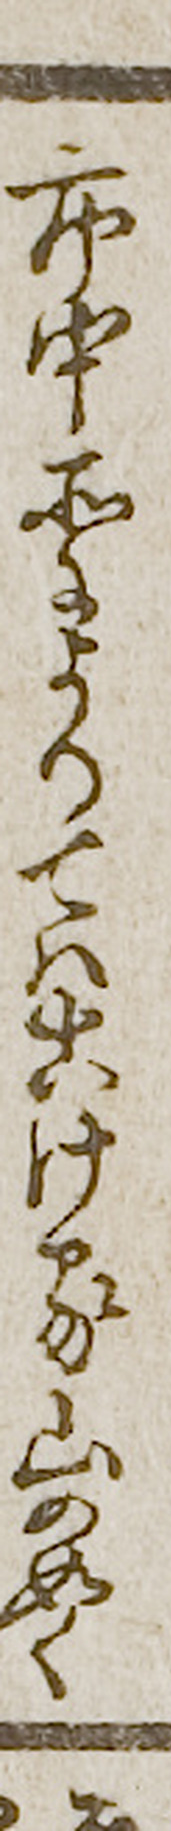市中所によりてはこけ家山の如く
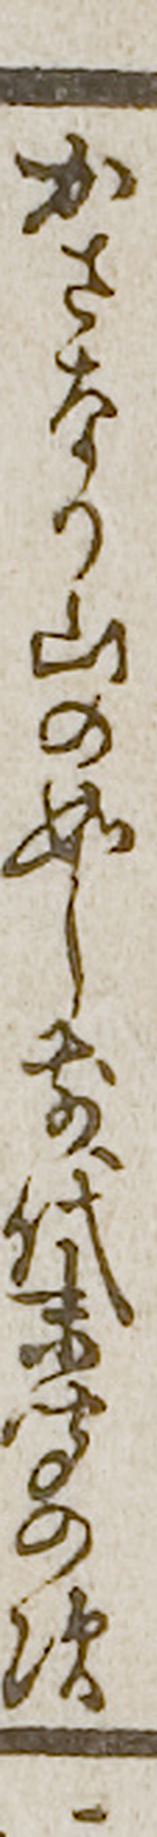かさなり山の如し前代未聞の次
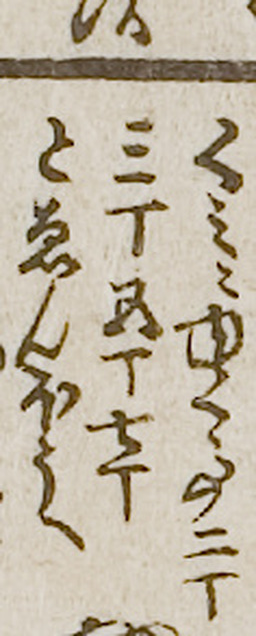三丁五丁七丁
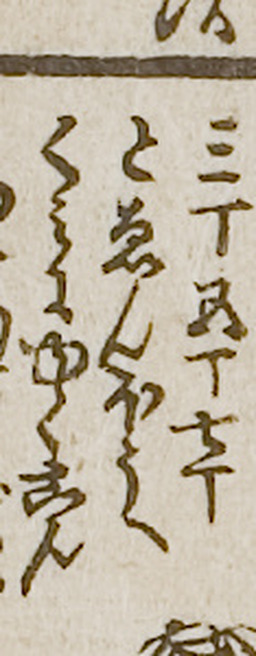とゑんほうへ
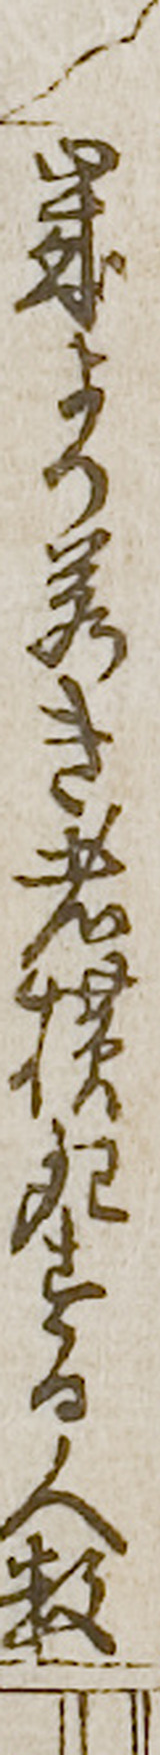歳より若き者横死する人数
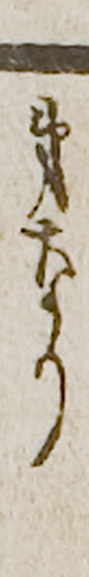第なり
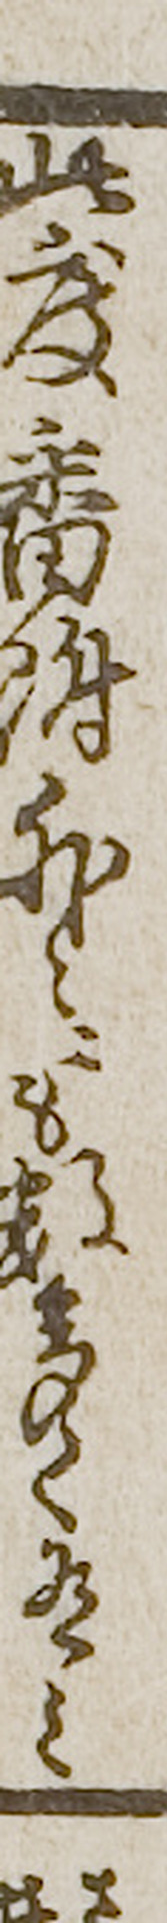此度番附外々にも数多く有之
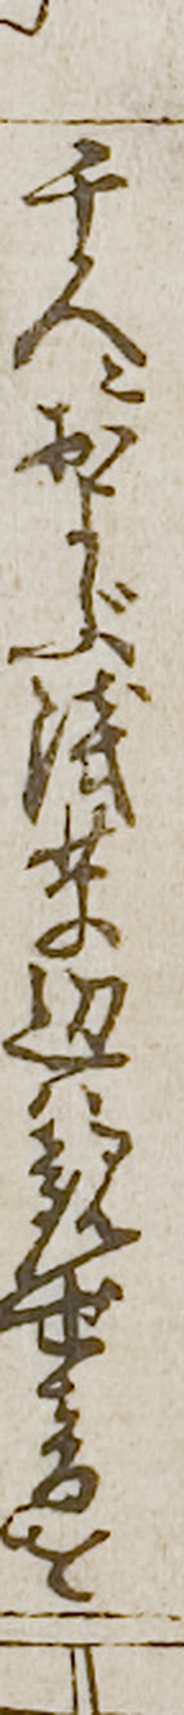千人におよぶ浅草辺は観世音を
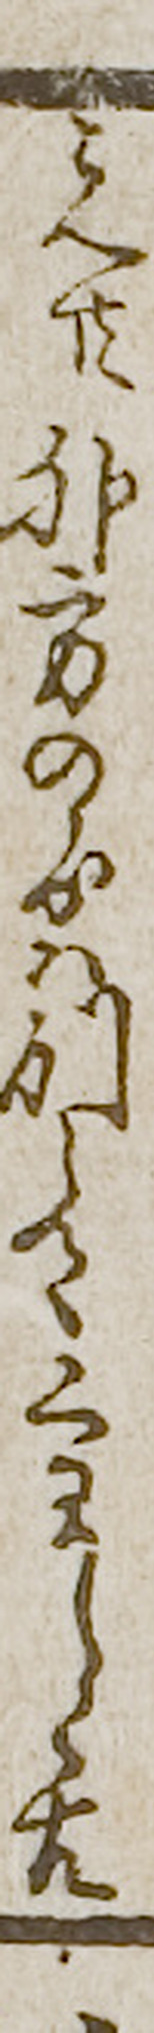候へ共外方の分は別してくわしくは
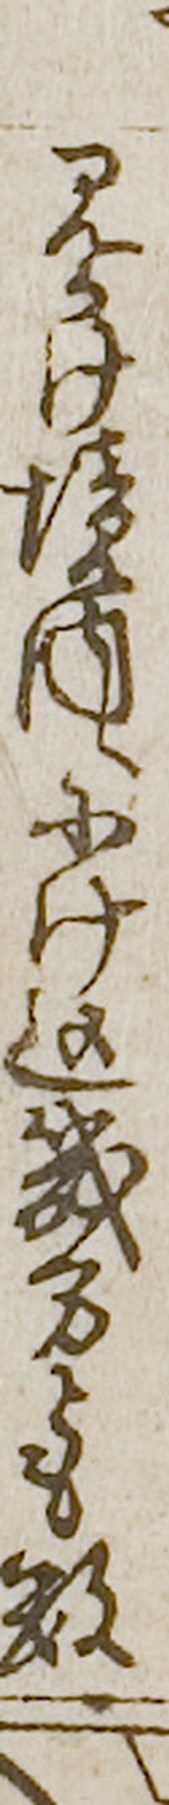見かけ境内へにけ込幾万とも数
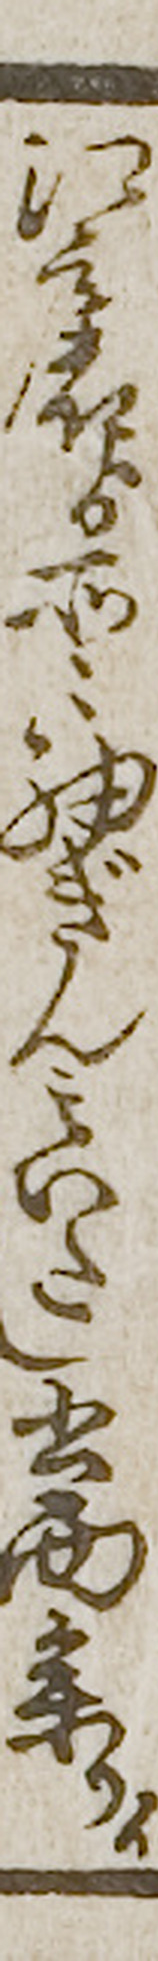江戸表ゟ所々細ぎんみいたし書面参り候
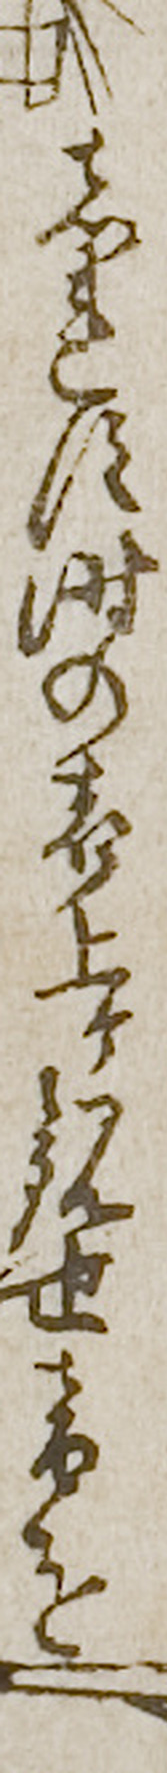しれす時の声上ヶ観世音を
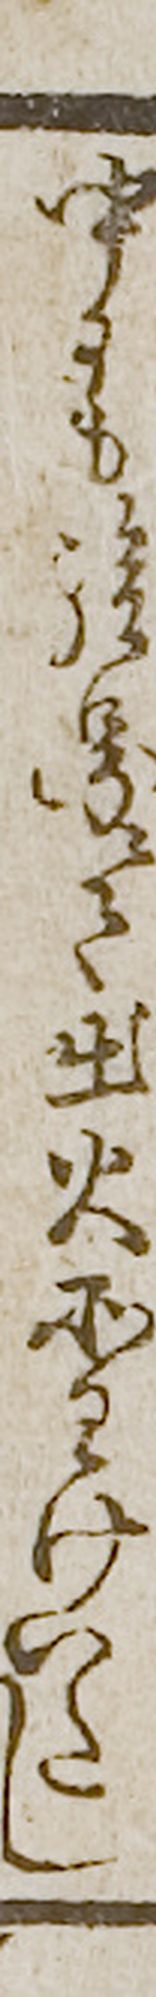中にも絵図にて出火所わけいたし
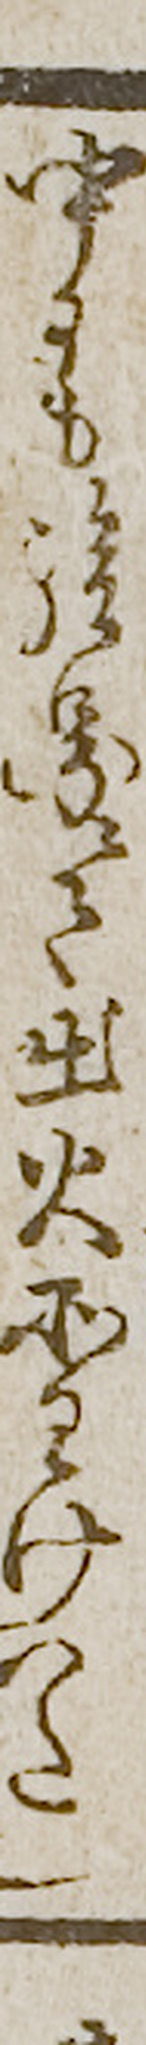中にも絵図にて出火所わけいたし
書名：東都珍事実録咄
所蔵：東京大学総合図書館 General Library in the University of Tokyo, JAPAN
